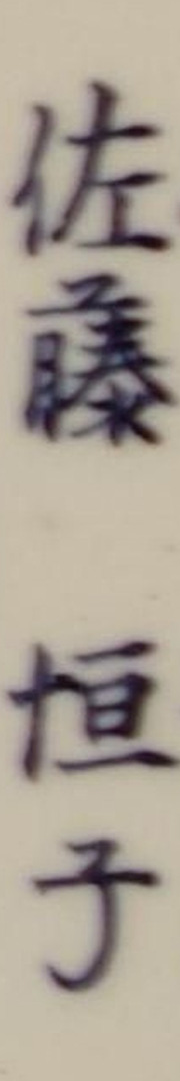佐藤恒子
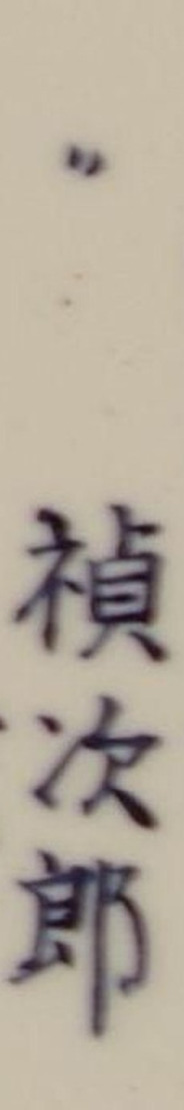禎次郎
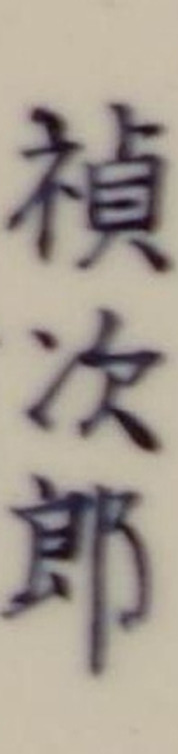禎次郎
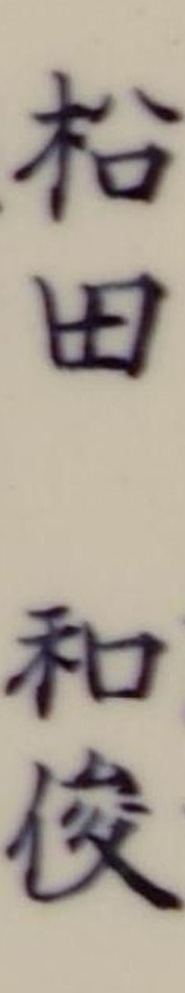松田和俊
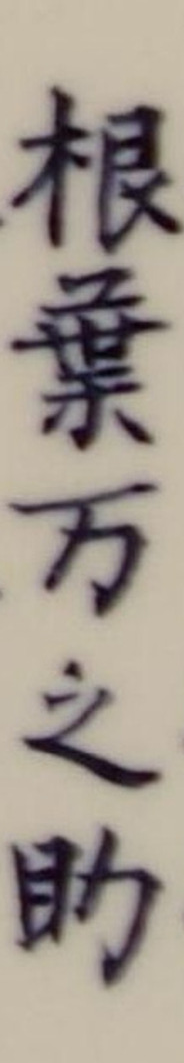根葉万之助
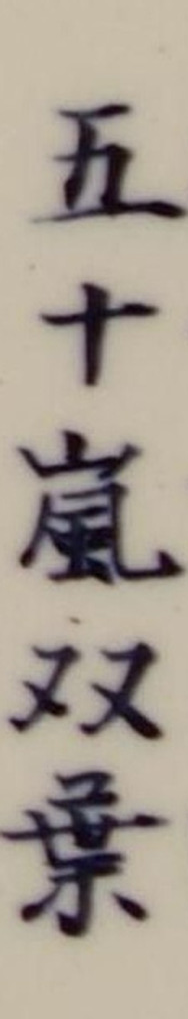五十嵐双葉
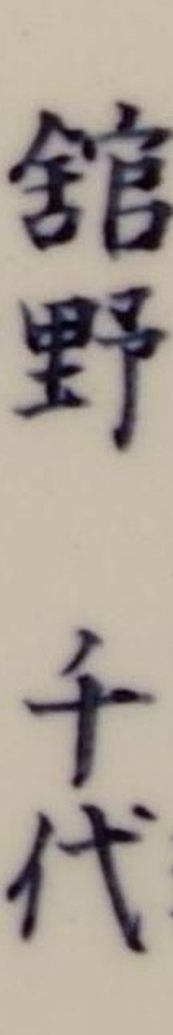舘野千代
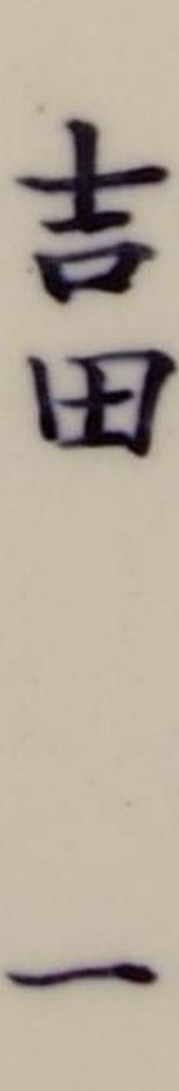吉田一
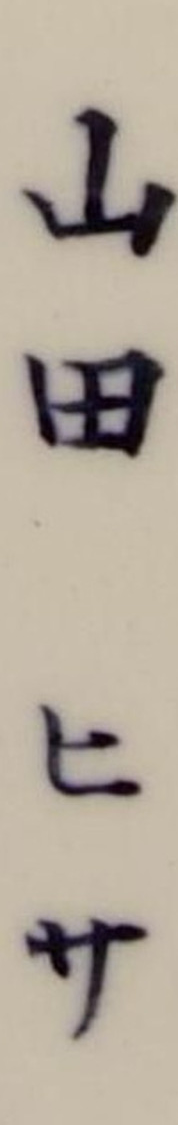山田ヒサ
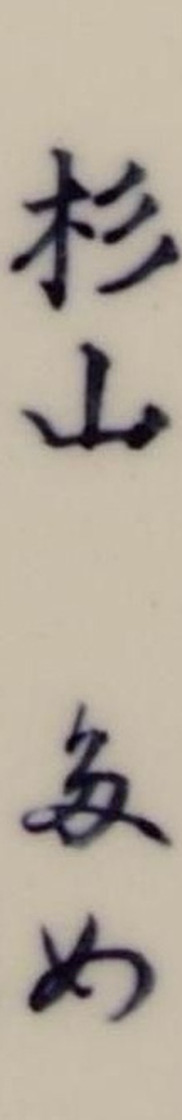杉山ため
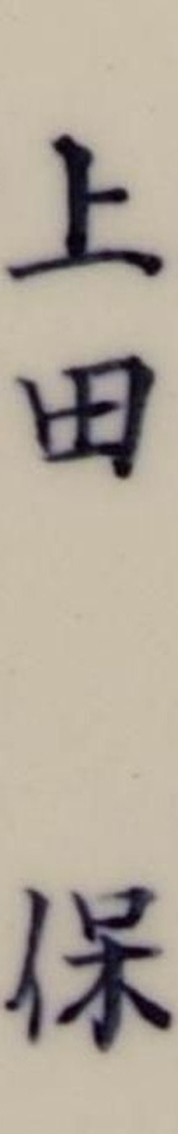上田保
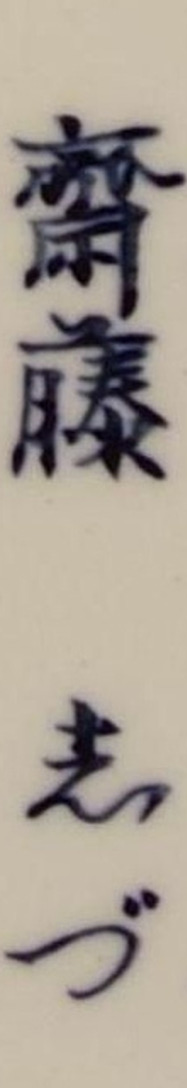斉藤しづ
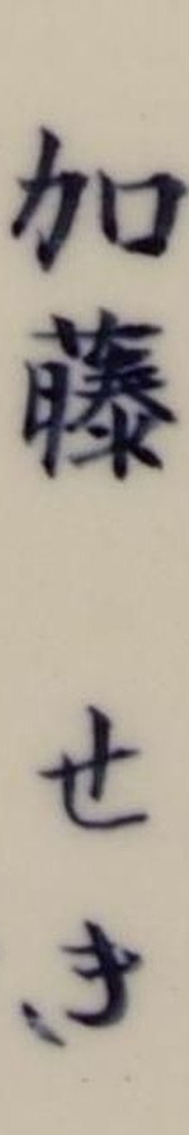加藤せき
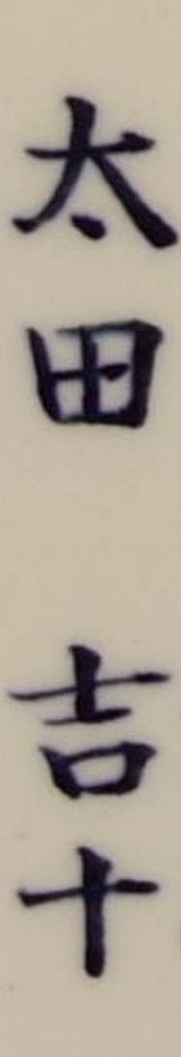太田吉十
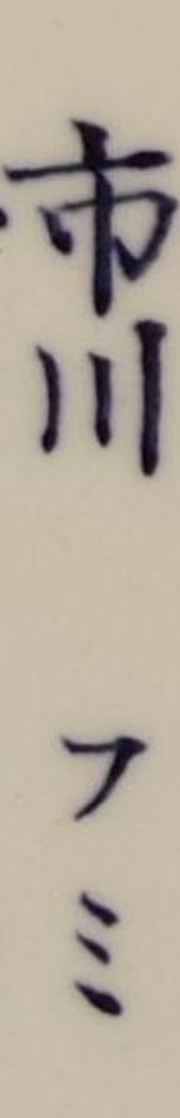市川フミ
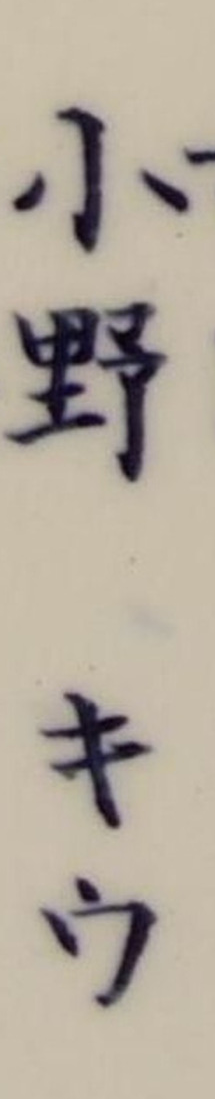小野キウ
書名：M~S
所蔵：高野山金剛峯寺
